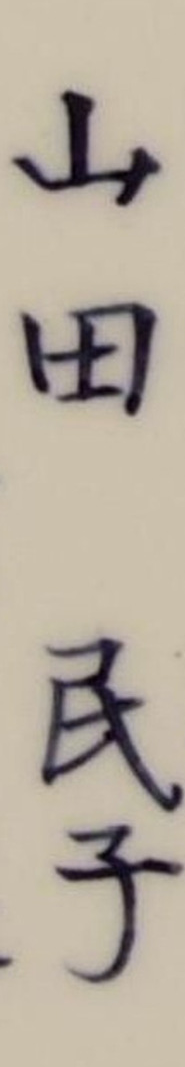山田民子
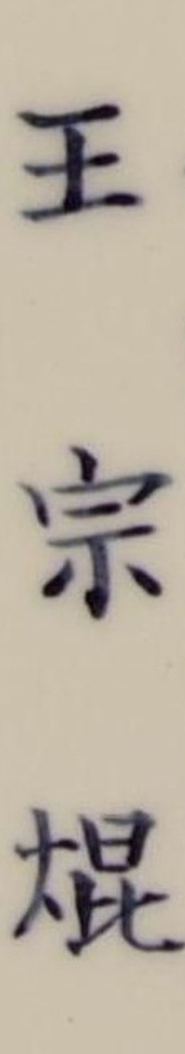王宗提
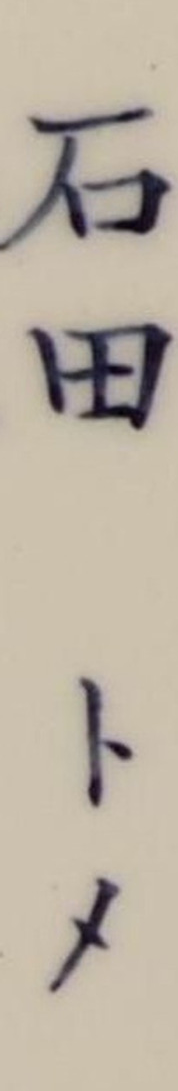石田トメ
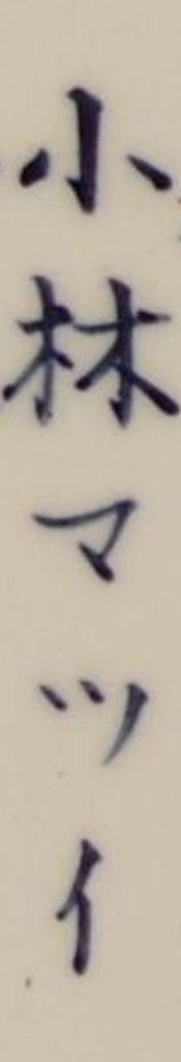小林マツイ
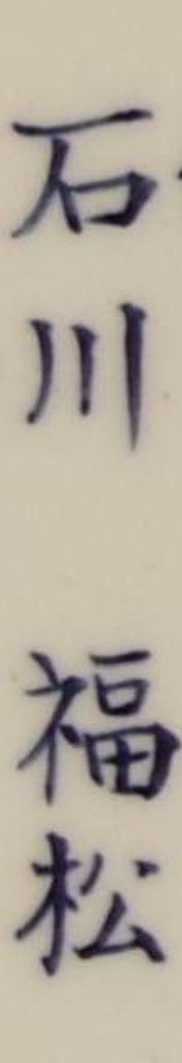石川福松
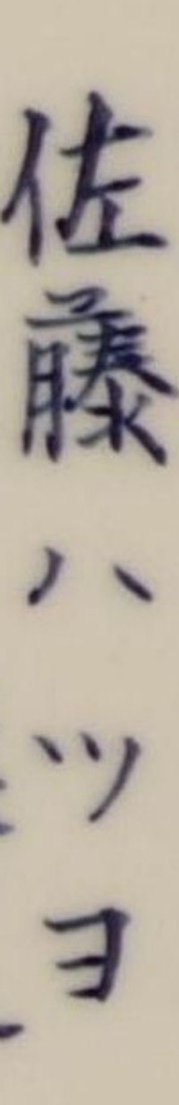佐藤ハツヨ
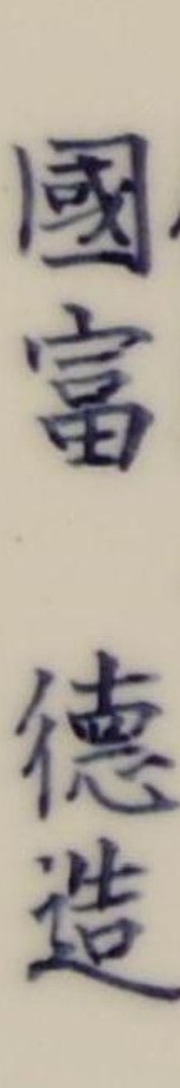国富徳造

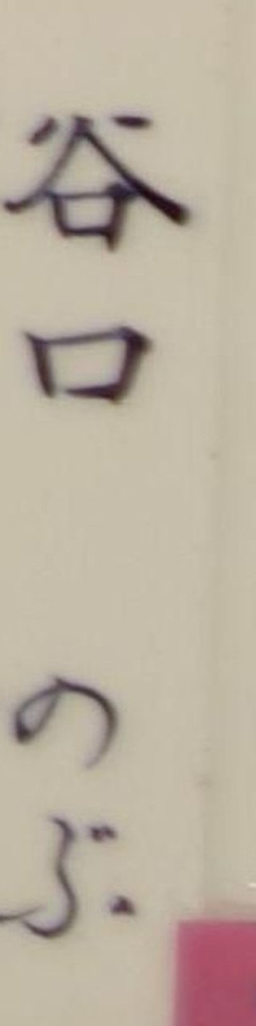谷口のぶ
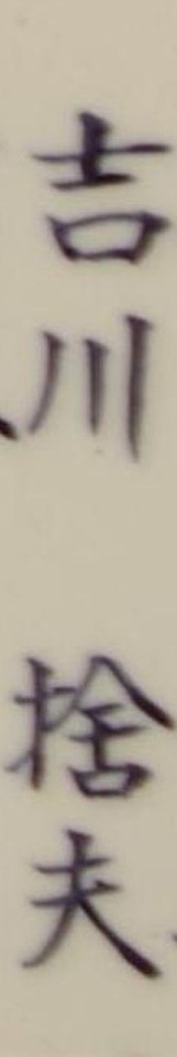吉川捨夫
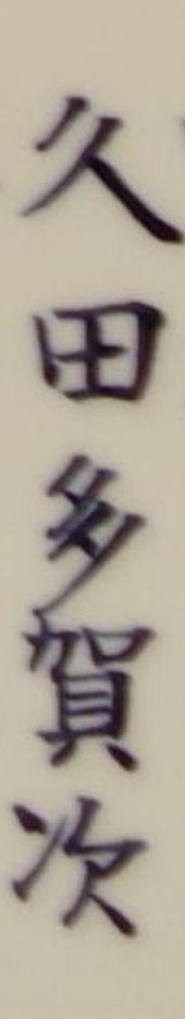久田多賀次
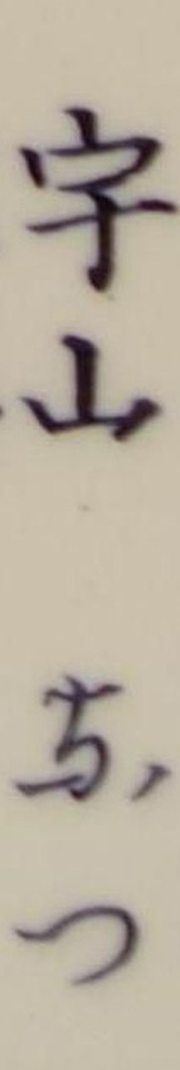宇山なつ
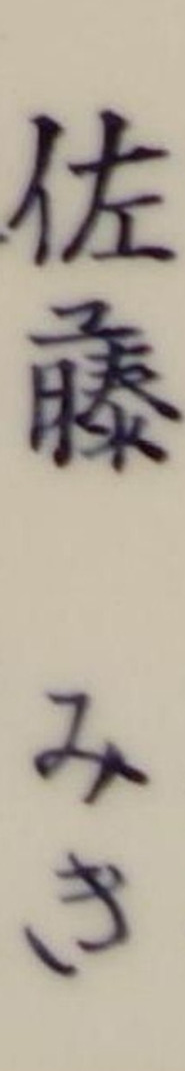佐藤みき
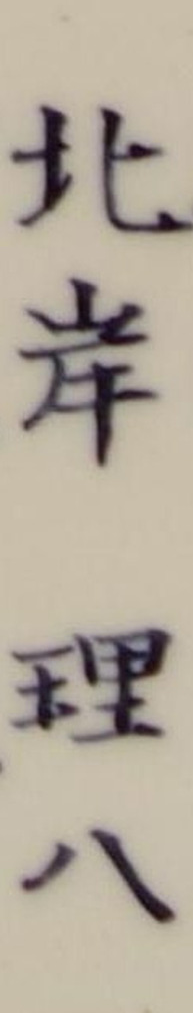北岸理八
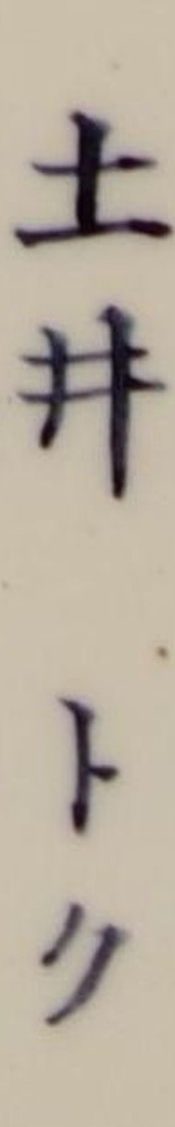土井トク
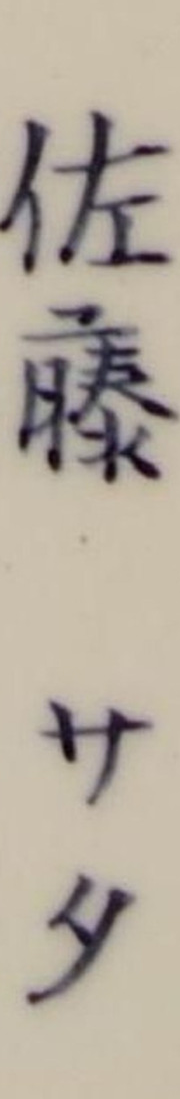佐藤サタ
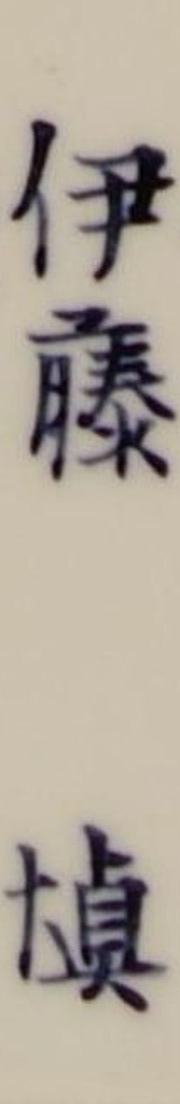伊藤慎
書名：M~S
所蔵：高野山金剛峯寺
